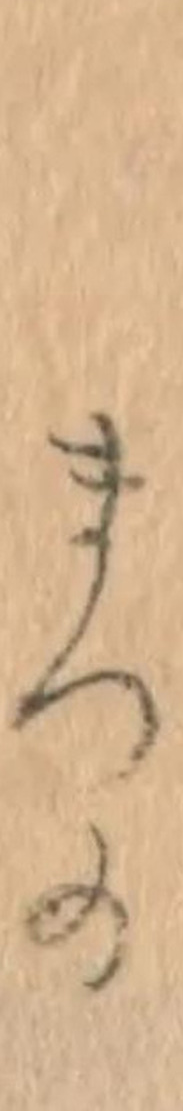まつの
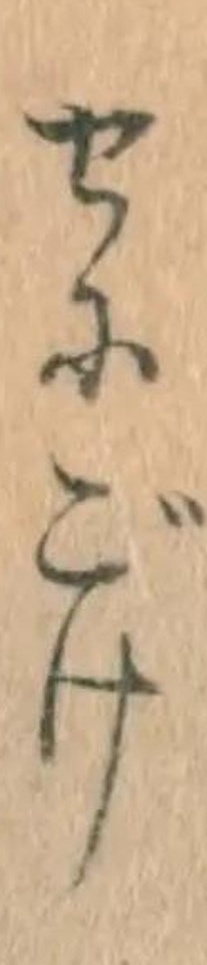せにごけ
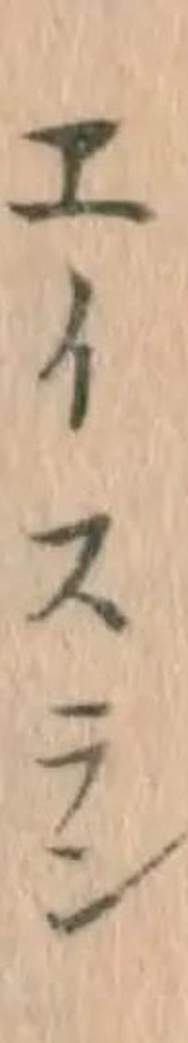ヱイスラン
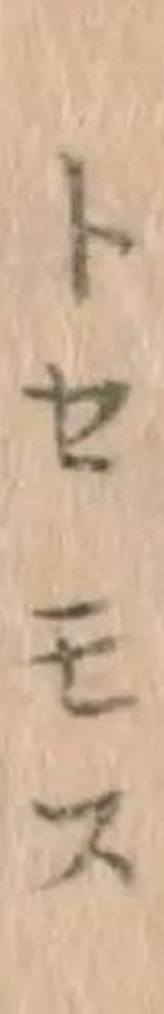トセモス
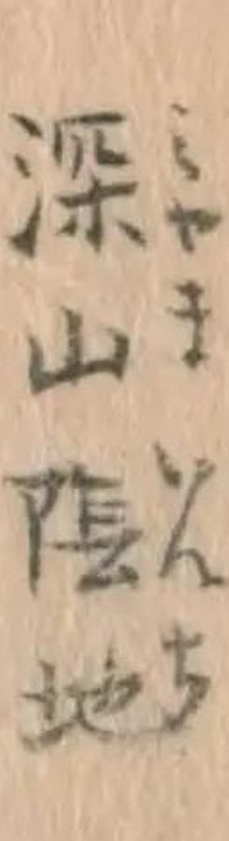深山陰地
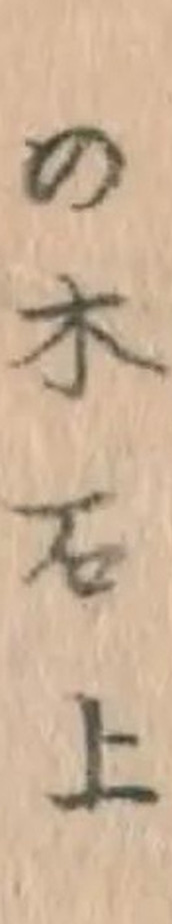の木石上
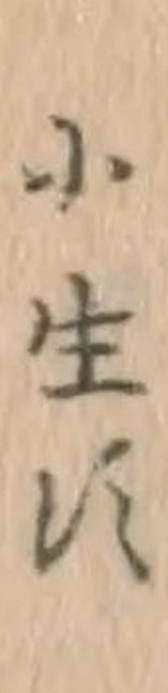に生す
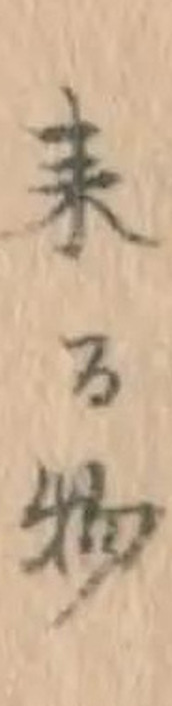来る物

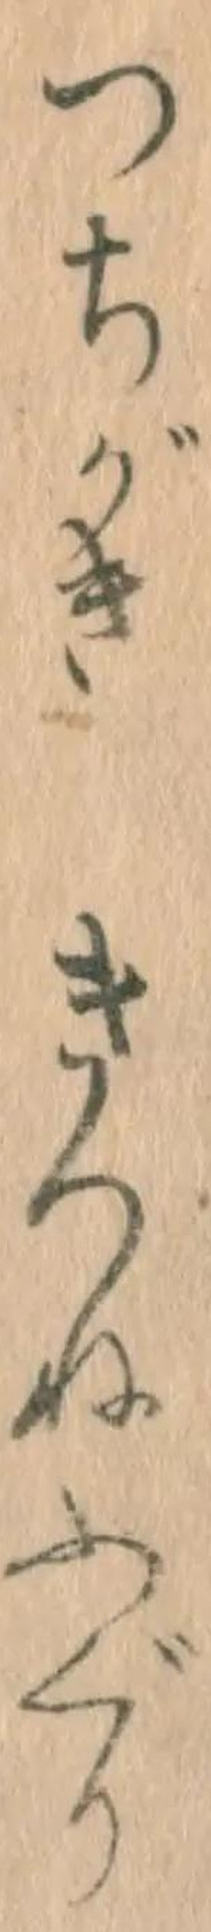つちがききつねふぐり
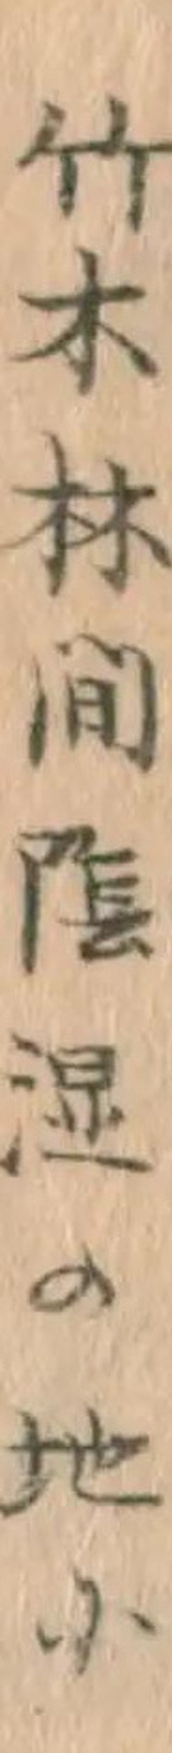竹木林間陰湿の地に
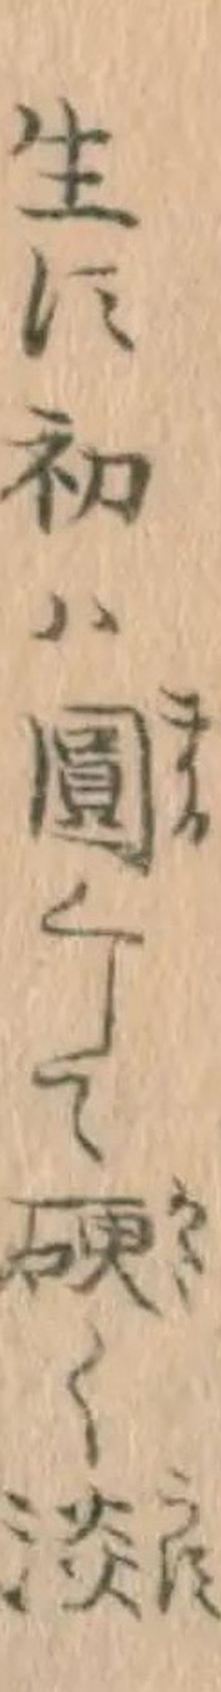生す初は円くして硬く淡
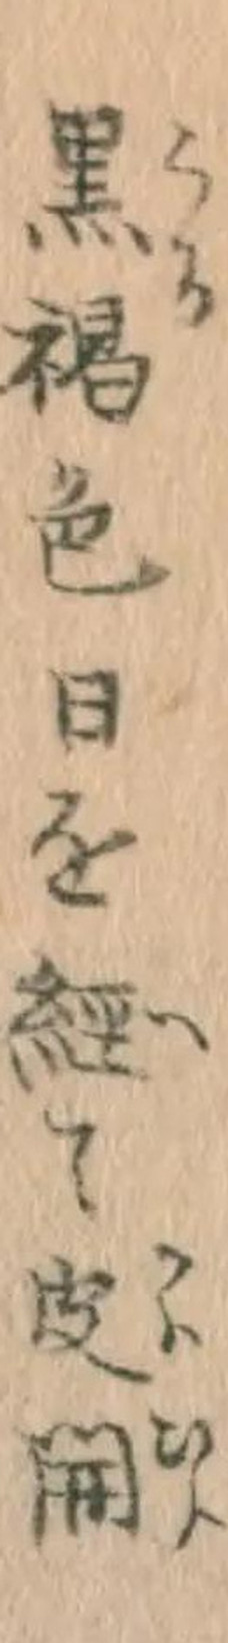黒褐色日を経て皮開
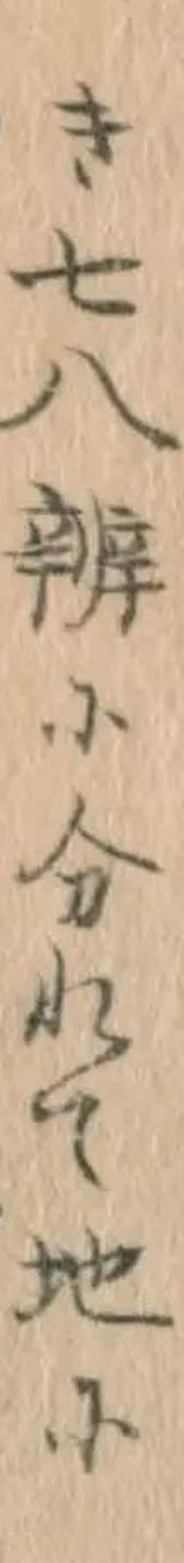き七八弁に分れて地に
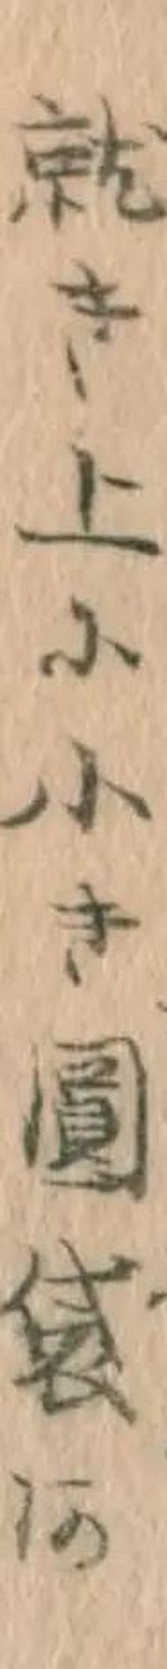就き上に小き円袋あ
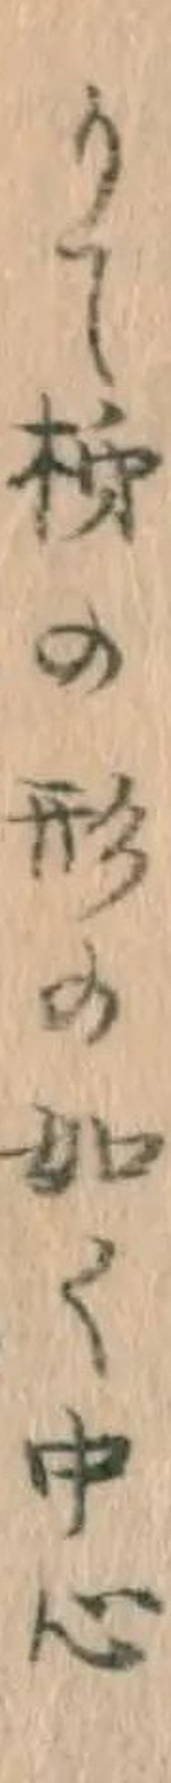りて柿の形の如く中心
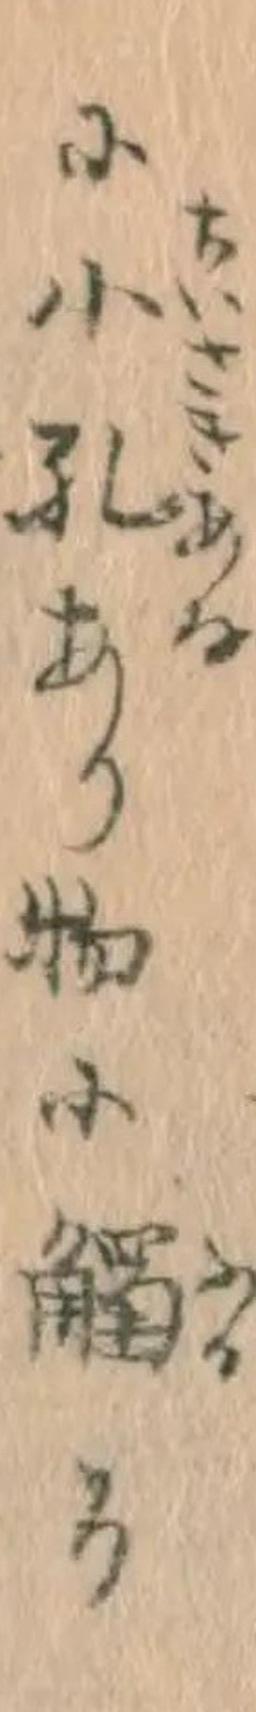に小孔あり物に触る
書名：本草図譜. 巻37-39
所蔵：国立国会図書館 National Diet Library, JAPAN
